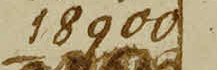18900
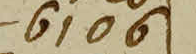6106
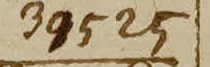39525
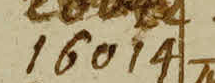16014
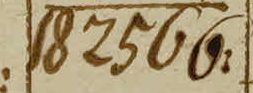182566
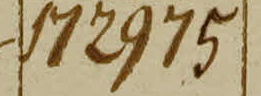172975
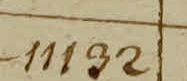11132
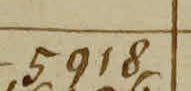5918
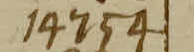14754
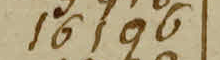16196
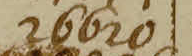26620
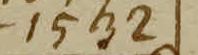1532
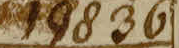19836
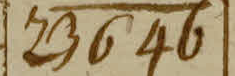23646
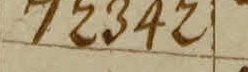72342
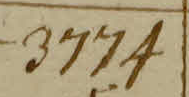3774
